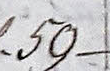59
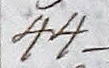44
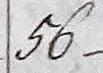56
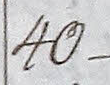40
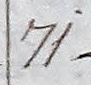71
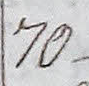70
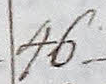46
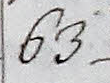63
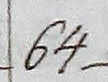64
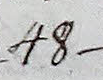48
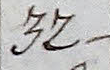37
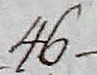46
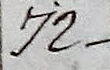72
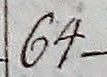64
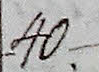40
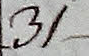31
